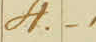4.
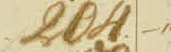204.
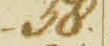58.
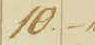10.
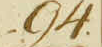94.
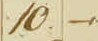10.
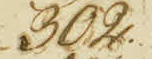302.
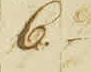6.
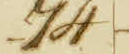74
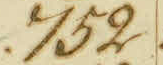752
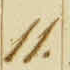11.
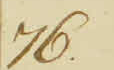76.
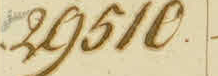29510.
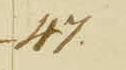47.
